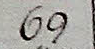69
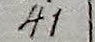41
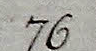76
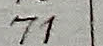71
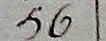56
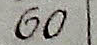60
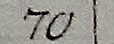70
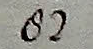82
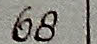68
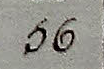56
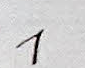1
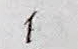1
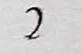2
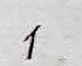1
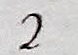2
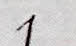1
